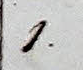1.
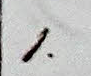1.
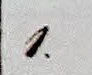1.
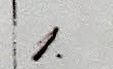1.
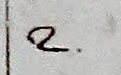2.
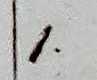1.
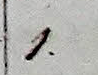1.
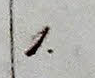1.
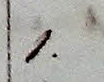1.
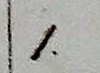1.
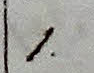1.
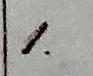1.
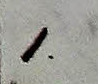1.
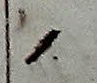1.
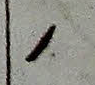1.
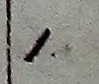1.
